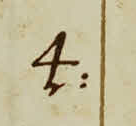4:
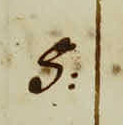5:
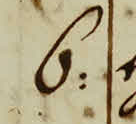6:
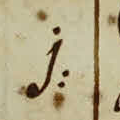1:
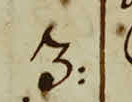3:
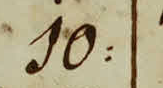10:
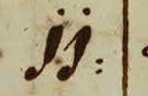11:
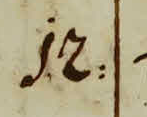12:
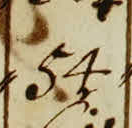54
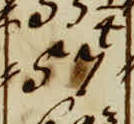57
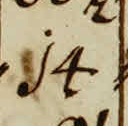14
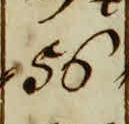56
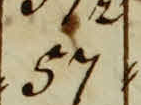57
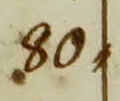80
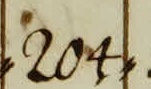204
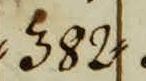382
